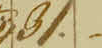31.
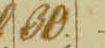30.
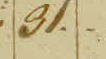31.
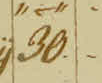30.
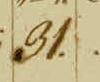31.
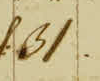31
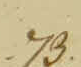73.
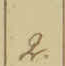2.
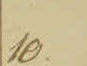10.
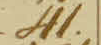41.
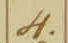4.
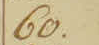60.
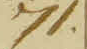71.
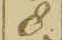8.
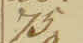75
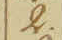2.
